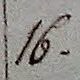16
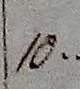10
